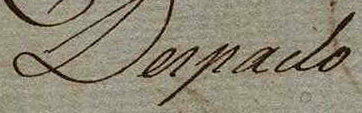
Despacho
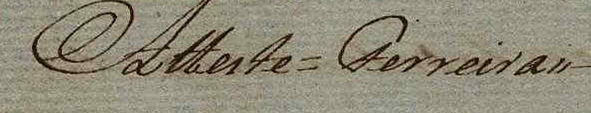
Atteste = Ferreira //
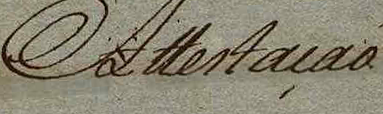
Attestaçaõ
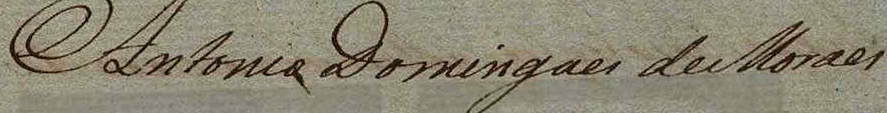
Antonio Domingues de Moraes
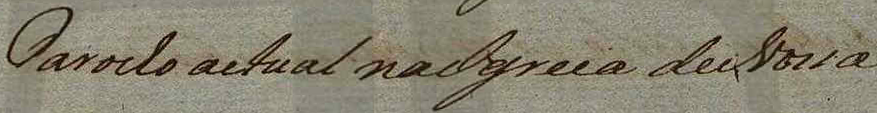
Parocho actual na Igreia de Nossa
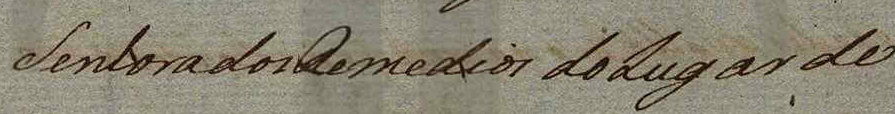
Senhora dos Remedios do Lugar de
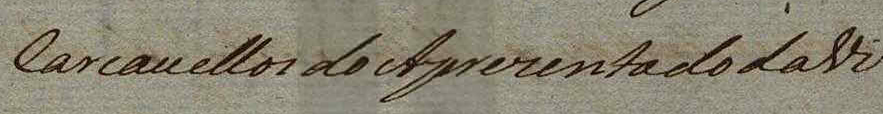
Carcauellos do Aprezentado da Vi
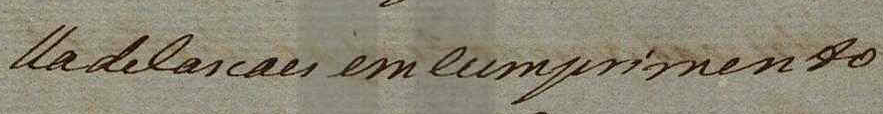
lla de Cascaes em cumprimento
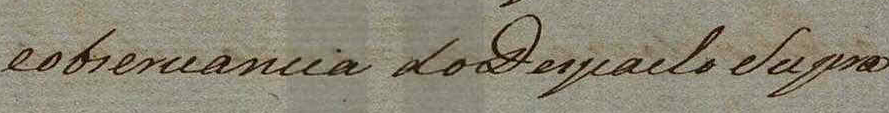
e obseruancia do Despacho supra
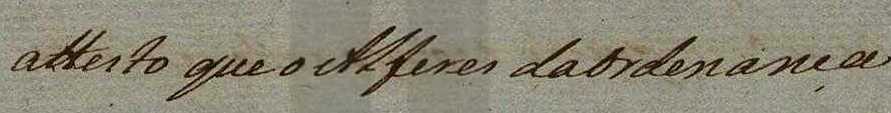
attesto que o Alferes da ordenança
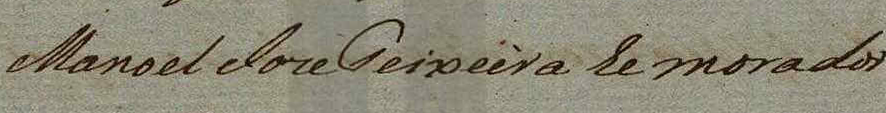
Manoel Ioze Teixeira he morador
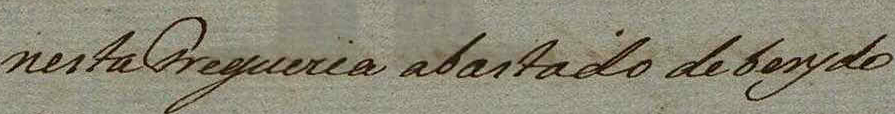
nesta Freguezia abastado de bens de
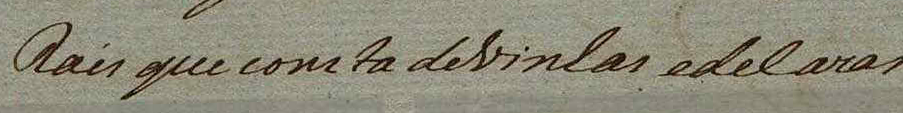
Rais que consta de Vinhas e de Cazas
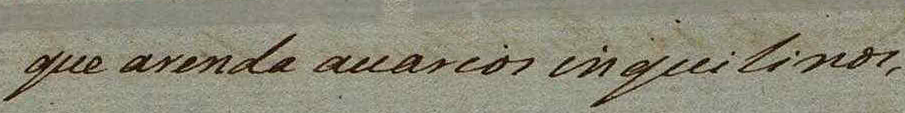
que arenda a uarios inquilinos,
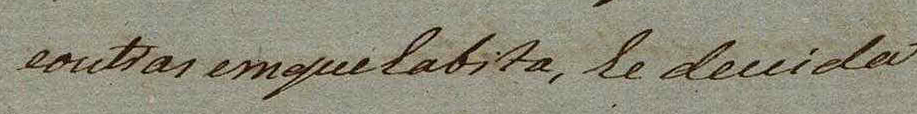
e outras em que habita, he de uida
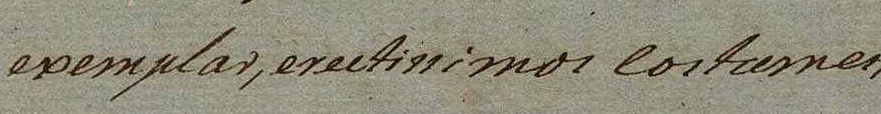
exemplar, e rectissimos costumes,
